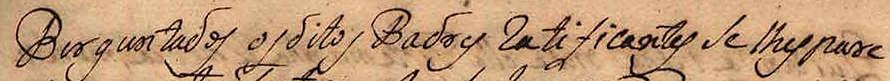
Perguntados os ditos Padres Ratificantes se lhes pare
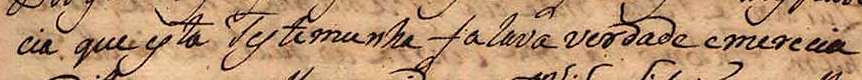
cia que esta Testemunha falava verdade e merecia
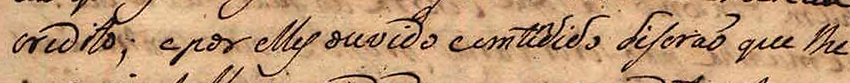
credito; e por elles ouvido e emtedido diseraõ que lhe
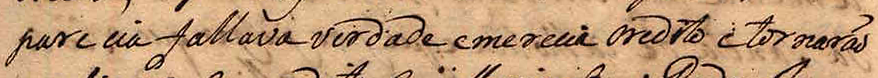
parecia fallava verdade e merecia credito e tornarão
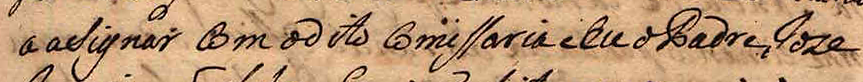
a aSignar com o dito Comissario e Eu o Padre Ioze
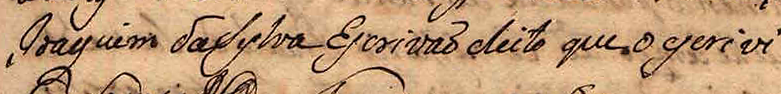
Ioaquim da Sylva Escrivaõ eleito que o escrivi
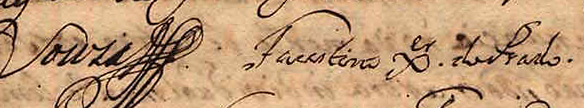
Souza Faustino x.er do Prado.
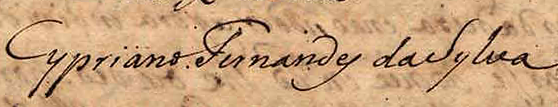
Cypriano Fernandes da Sylva
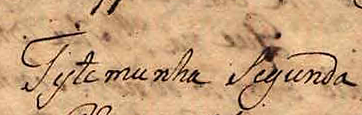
Testemunha Segunda
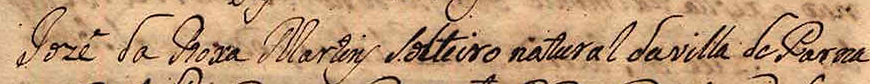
Iozé da Roxa Martins solteiro natural da villa de Parna
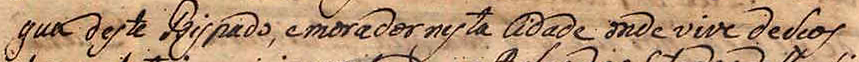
gua deste Bispado, e morador nesta Cidade onde vive de seos
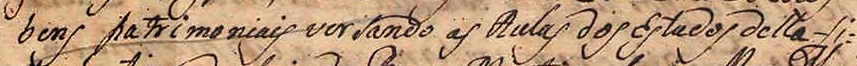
bens patrimoniaes versando as Aulas dos Estados della fi
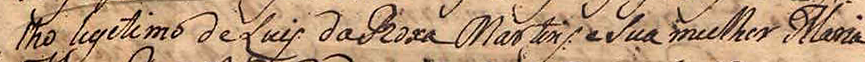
lho legitimo de Luis da Roxa Martins, e sua mulher Maria
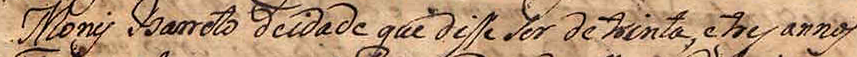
Monis Barreto de idade que disse ser de trinta, e tres annos
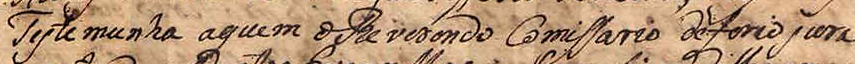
Testemunha a quem o Reverendo Comissario deferio jura
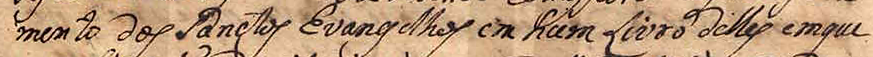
mento dos Sanctos Evangelhos em hum Livro delles em que
